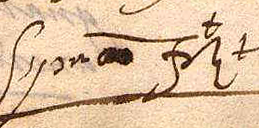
Sijmão frz
